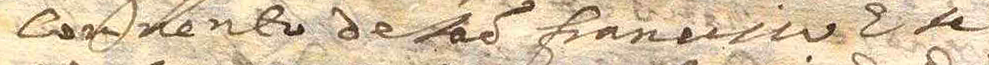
conuento de saõ francisco E se
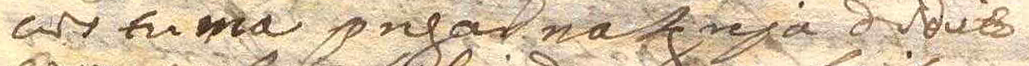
costuma pregar na Igreja do dicto
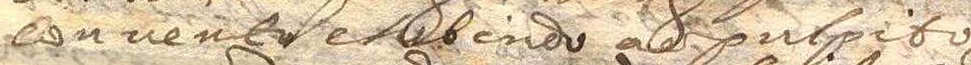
conuento e subindo ao pulpito
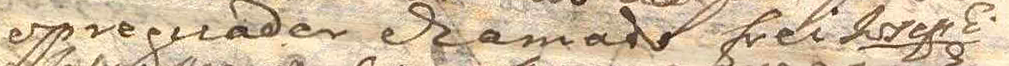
o preguador chamado frei Ioseph
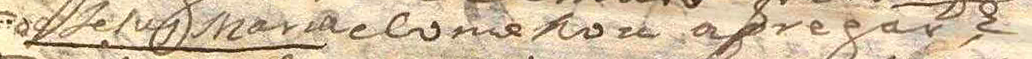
de Iesus Maria e comessou a pregar, E
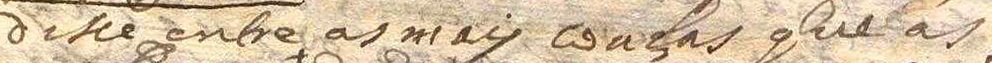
disse entre as mais couzas que as
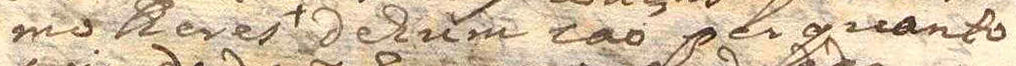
molheres de hum saõ porquanto
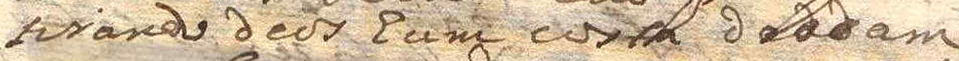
tirando deos hum costa de adam
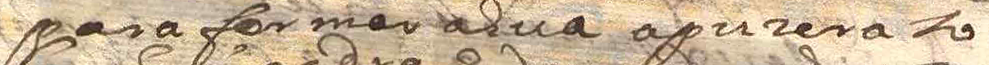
para formar a hua a puzera so
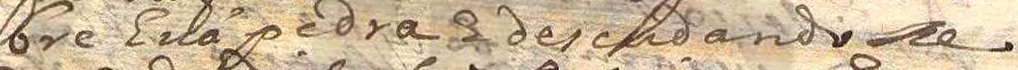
bre huā pedra E descudando lhe
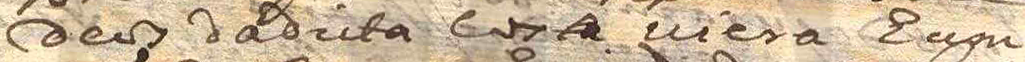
deos da dicta costa uiera hum
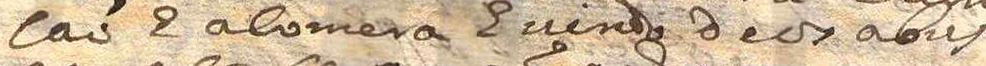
caõ E a comera E uindo deos a bus
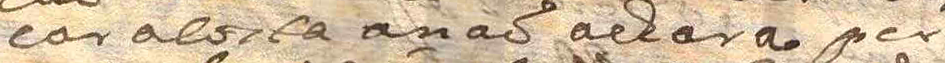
car a costa a naõ achara per
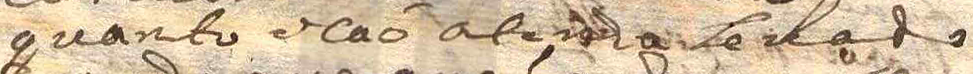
quanto o caõ a tinha leuado
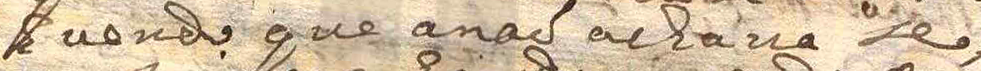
E uendo que a naõ achaua se
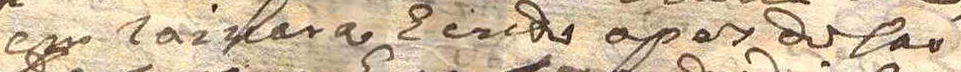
emraiuara E indo a pes do Caõ
